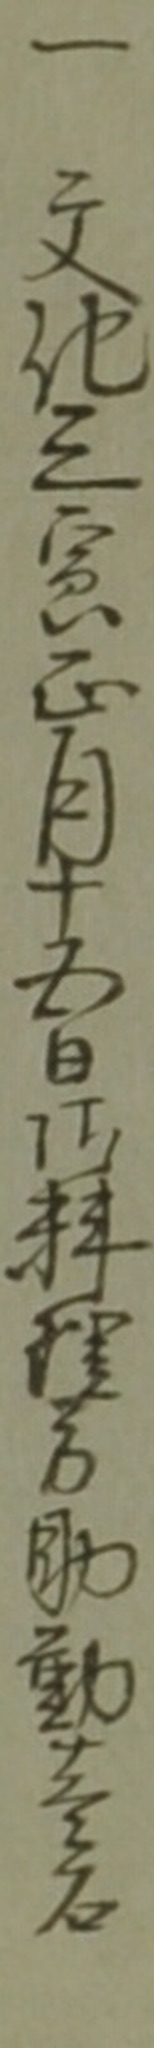一文化三寅正月十五日御料理方助勤壱石
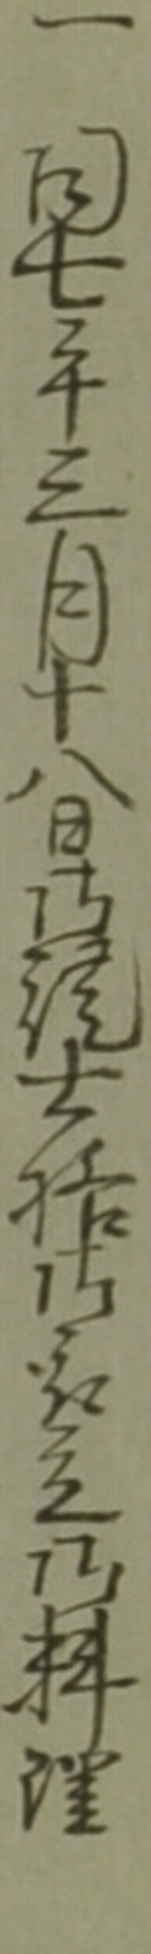一同七午三月十八日御徒士格御取立御料理
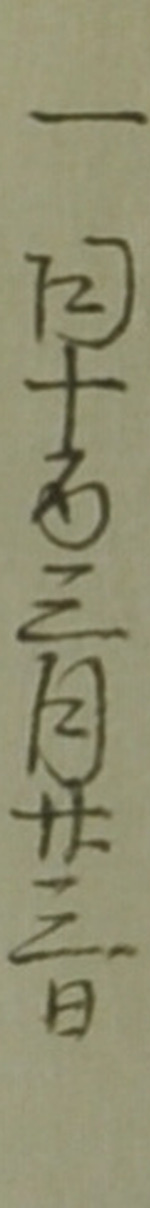一同十酉三月廿三日
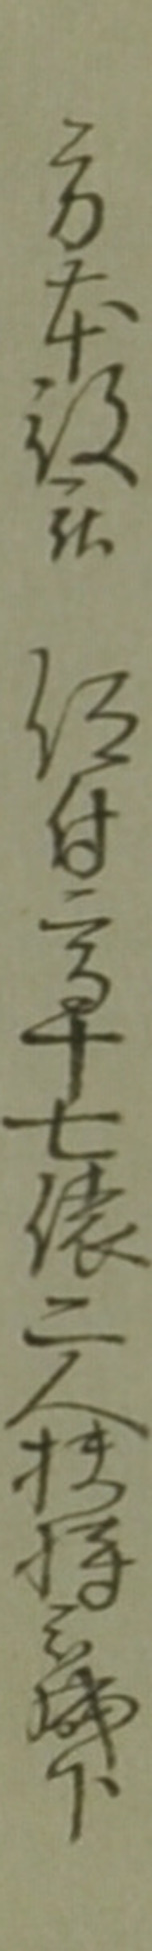方本役被仰付高十七俵二人扶持被成下
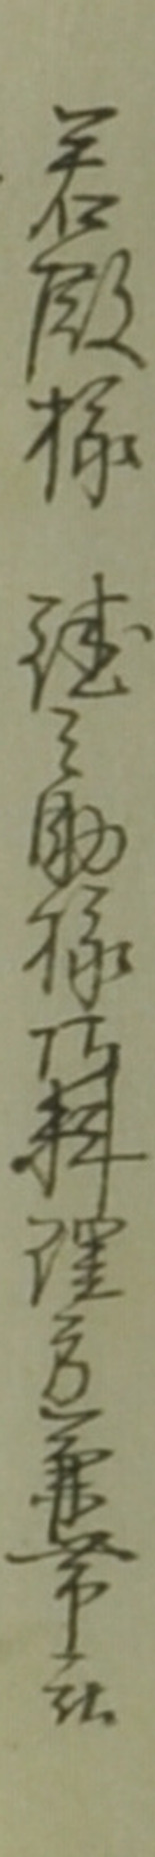若殿様銈之助様御料理方兼帯被

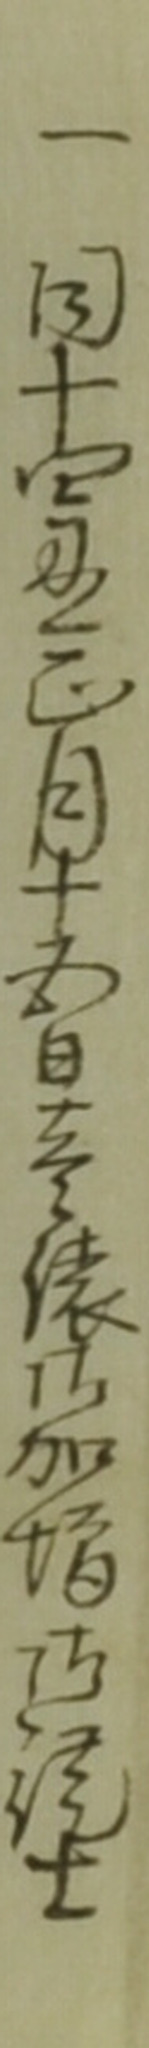一同十四丑正月十五日壱俵御加増御徒士
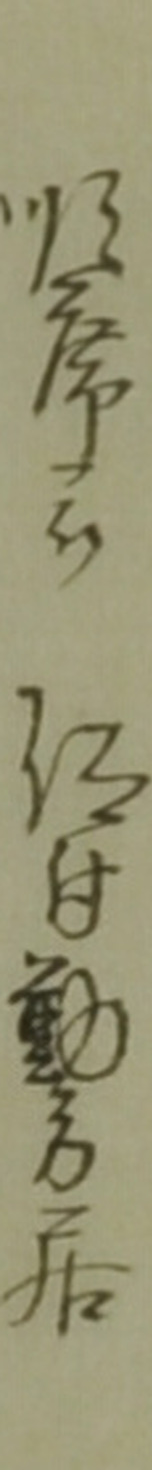順席被仰付勤方居
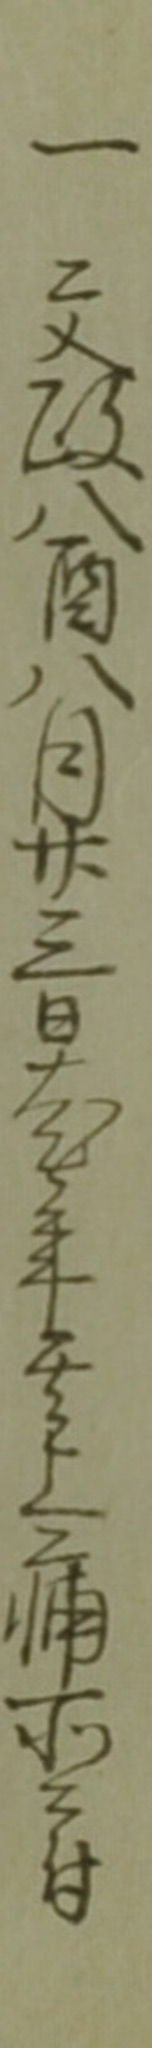一文政八酉八月廿三日老年其上痛所ニ付
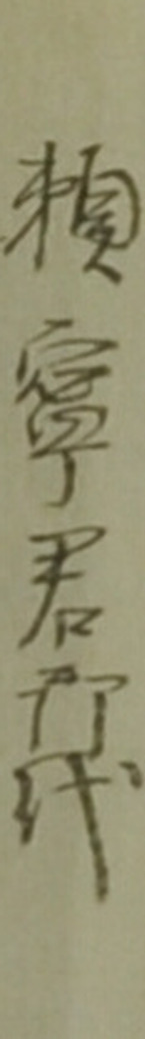頼寧君御代
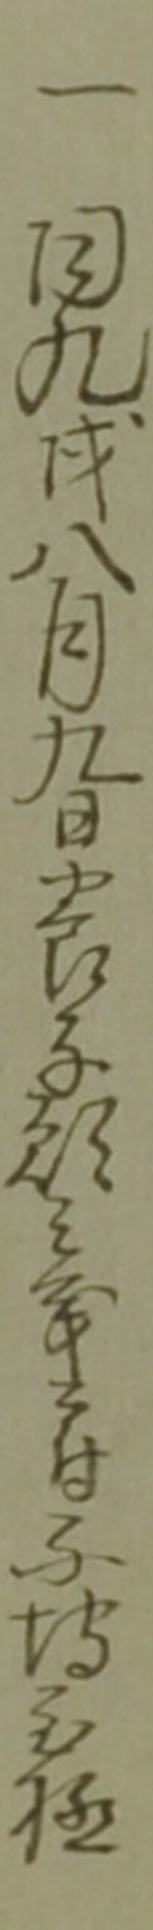一同九戌八月九日養子願之義ニ付不埒至極
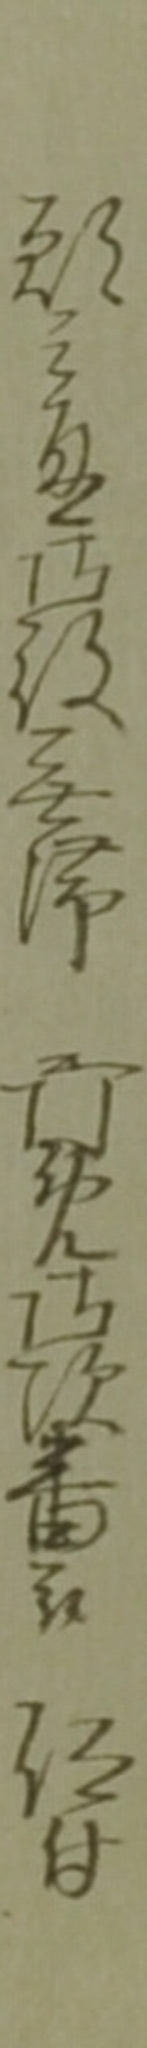願之通御役無滞御免御次番被仰付
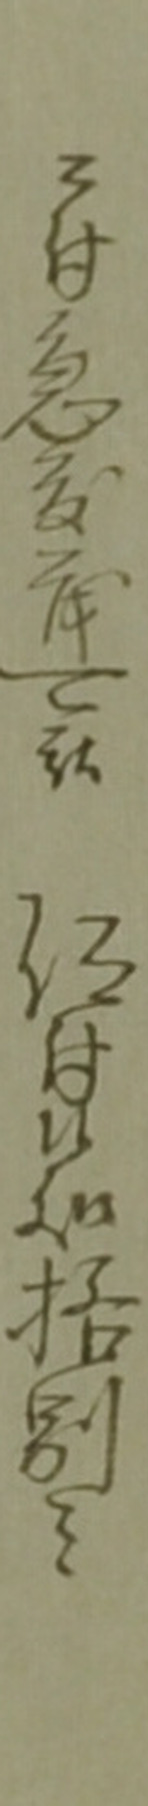ニ付急度茂可被仰付候処格別之
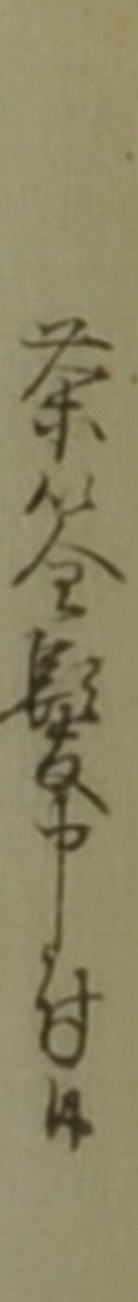茶筌髪申付候
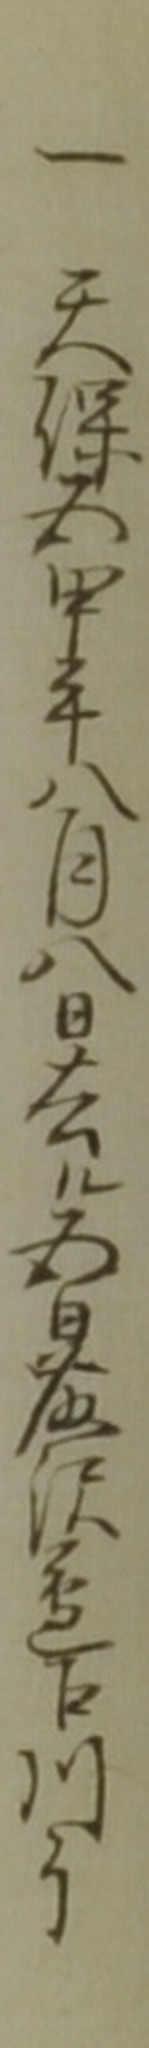一天保五甲午八月八日去ル五日藤沢辺江川に
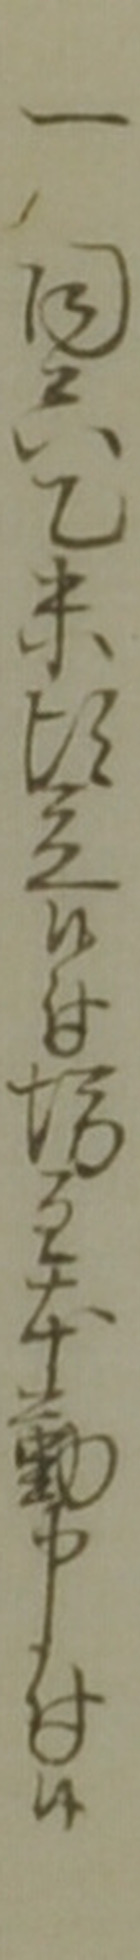一同六乙未頃立候付坊主本勤申付候
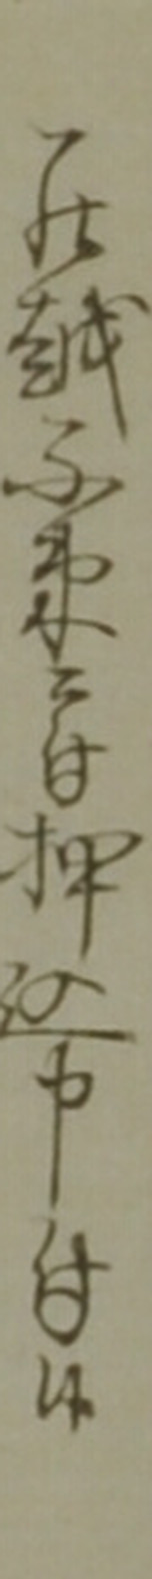罷越不束ニ付押込申付候
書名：無足諸士勤仕録（八）
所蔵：伊那市立高遠町図書館・合同会社AMANE
